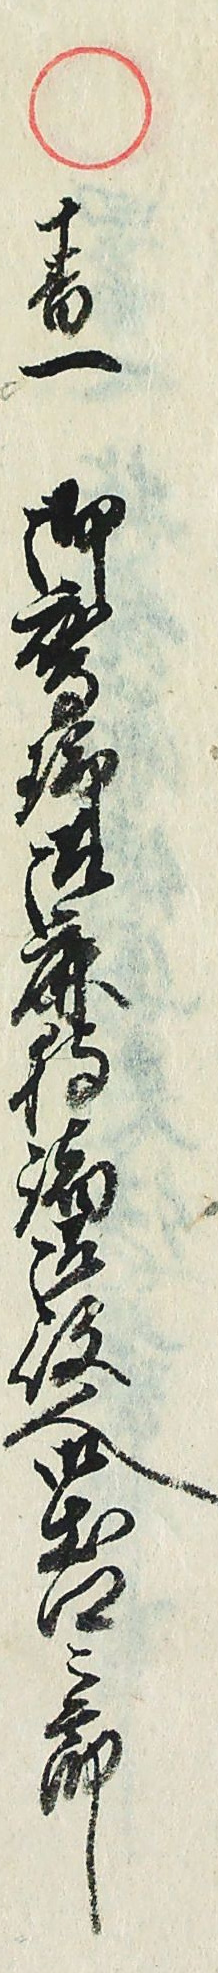十番一御鷹野御鹿狩諸御役人御出郷之節
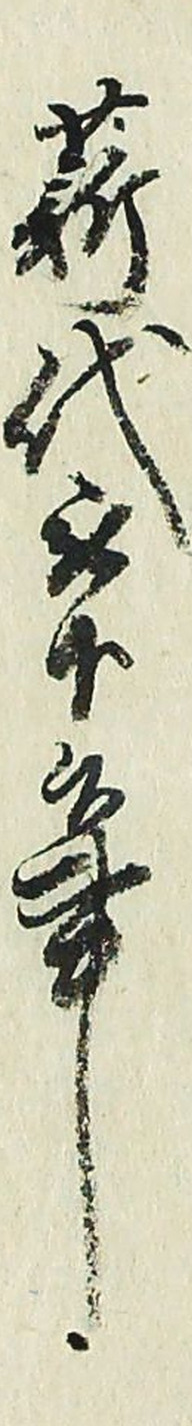薪代被下候事
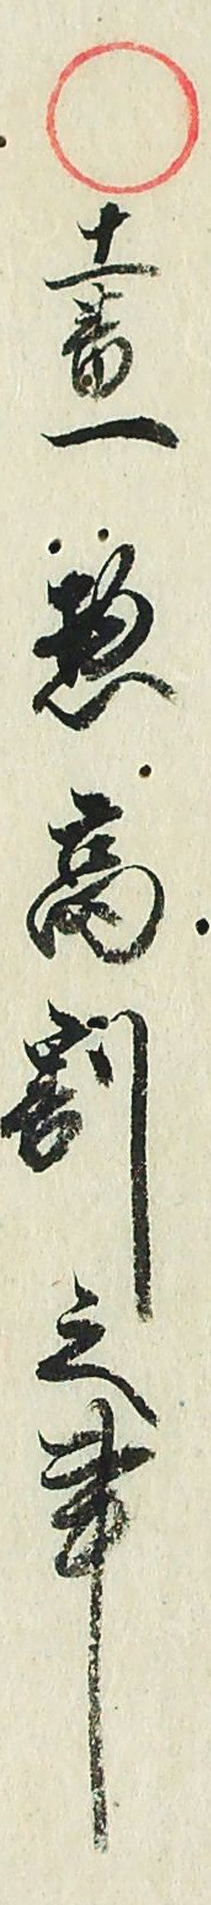十一番一惣高割之事
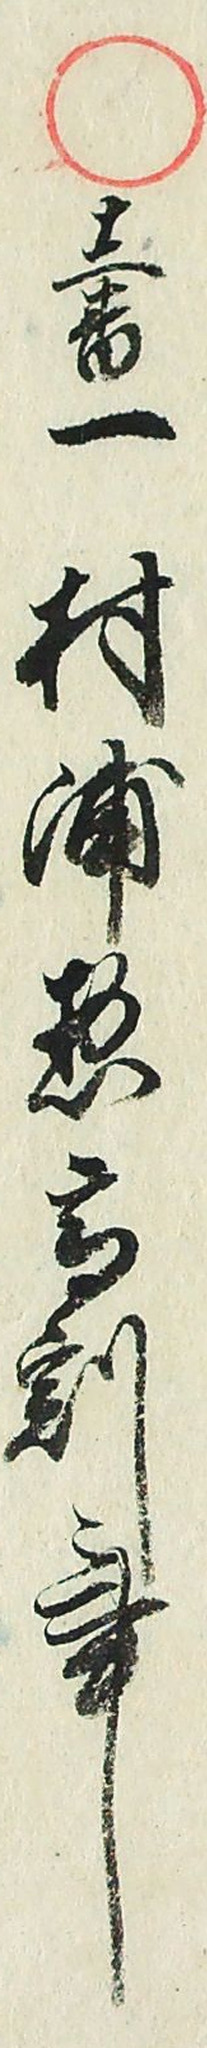十二番一村浦惣高割之事
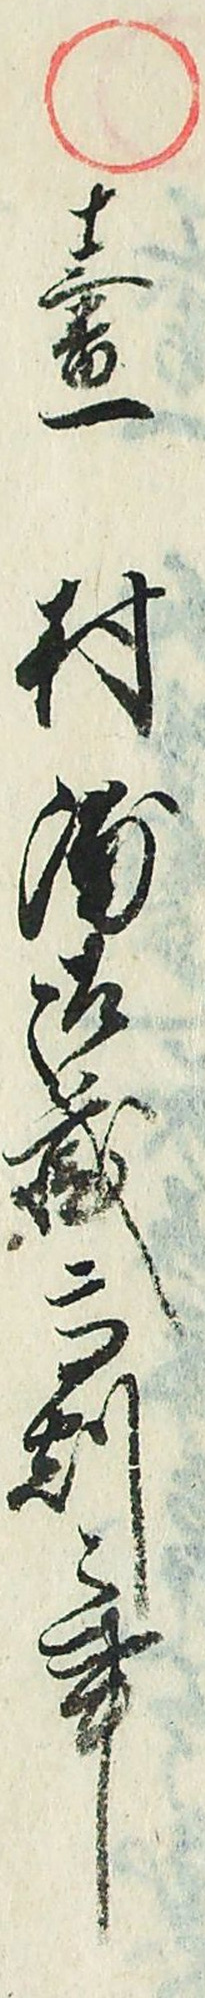十三番一村浦御蔵高割之事

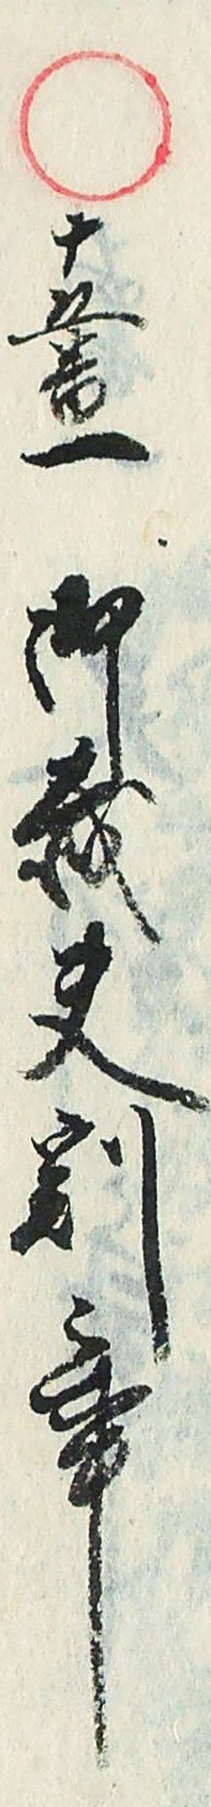十五番一御蔵夫割之事
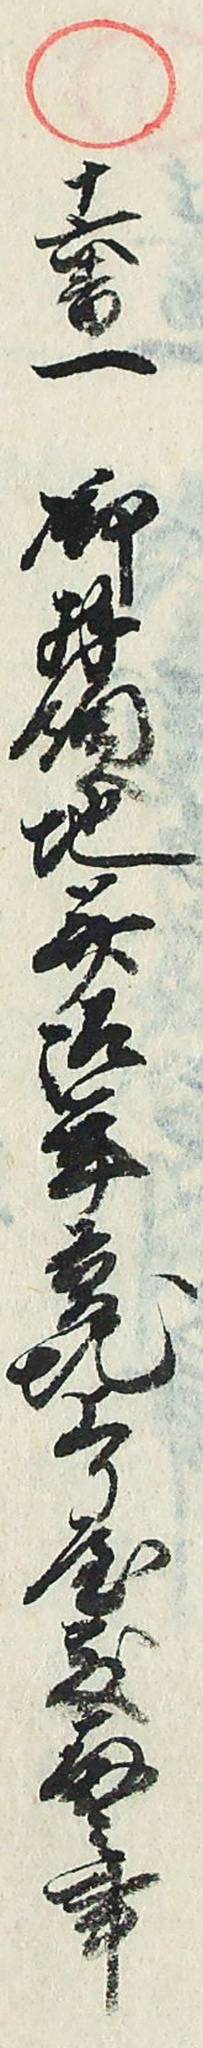十六番一御拝領地幷御年貢地上り屋敷番之事

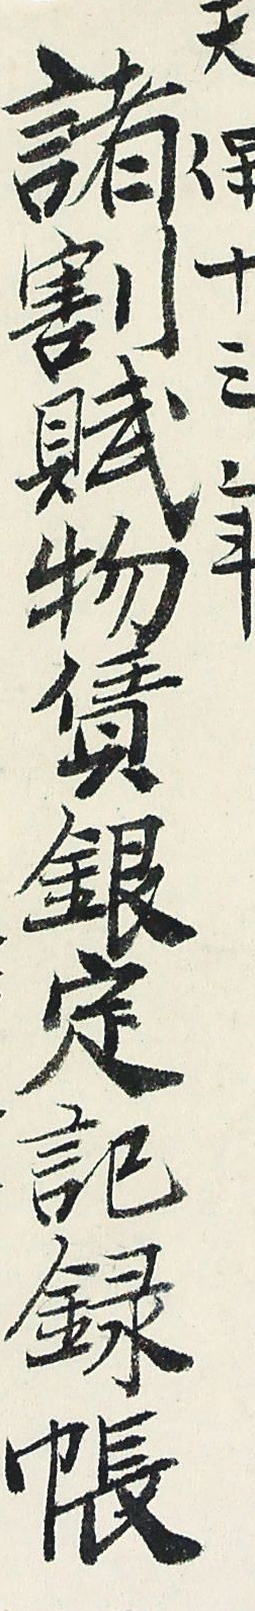諸割賦物賃銀定記録帳
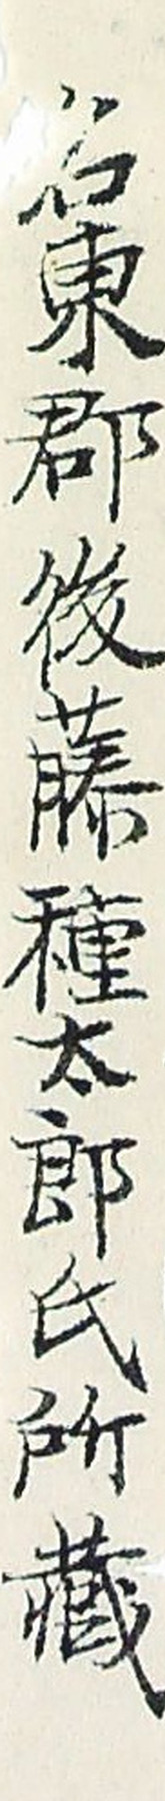名東郡後藤種太郎氏所蔵

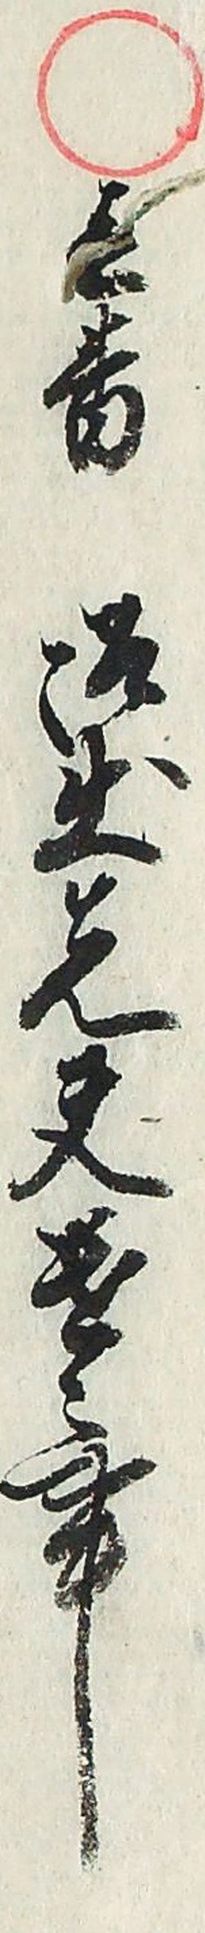一番御出先夫遣之事
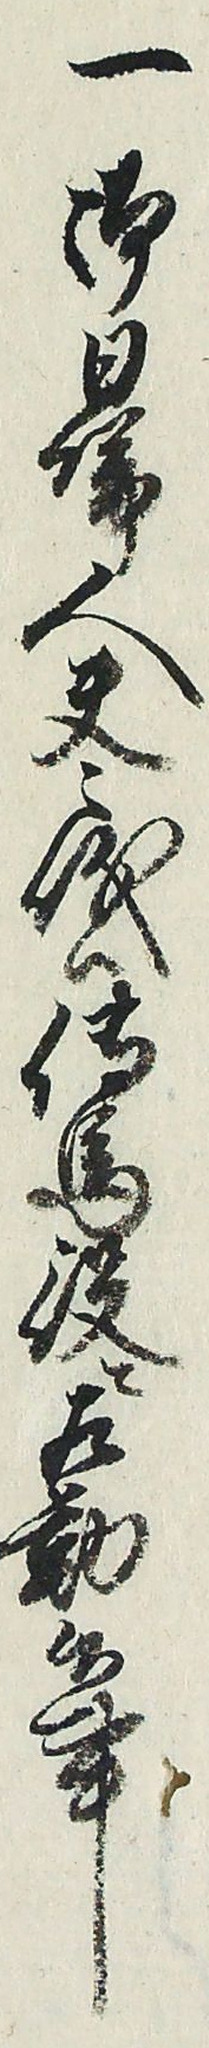一御日帰人夫之儀は伝馬役相勤候事
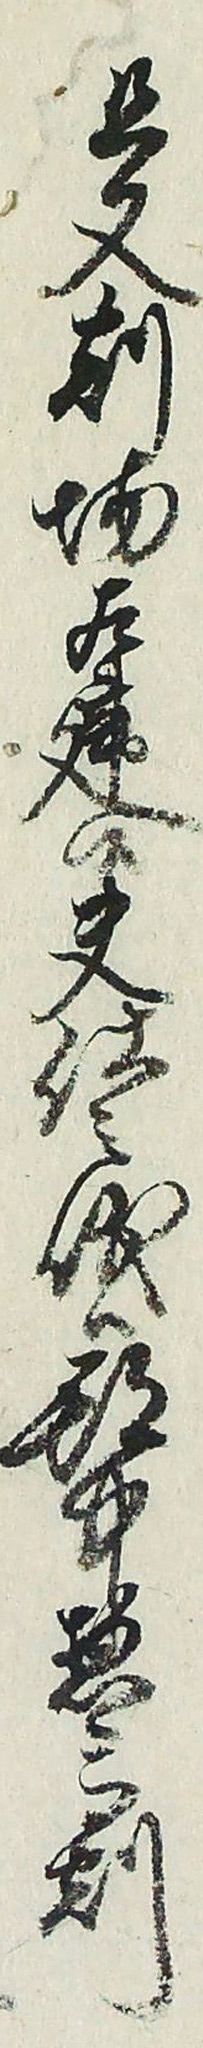且又割場相建候夫仕之儀は郡中惣高割
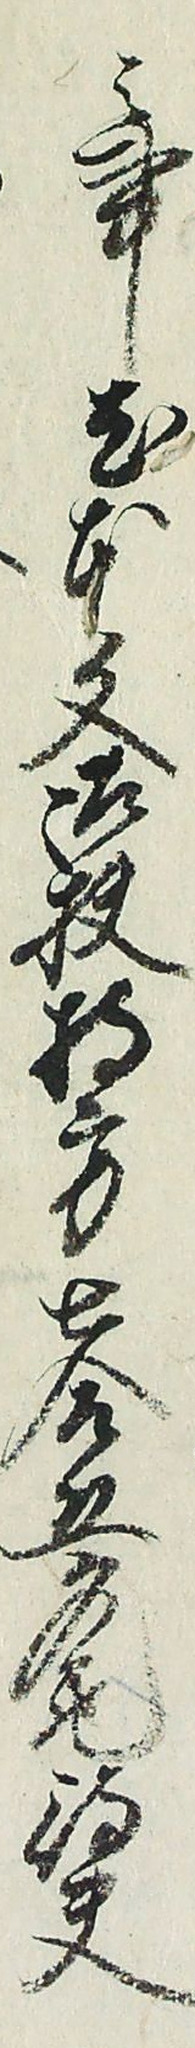之事尤本文御扶持方七合五勺宛待夫
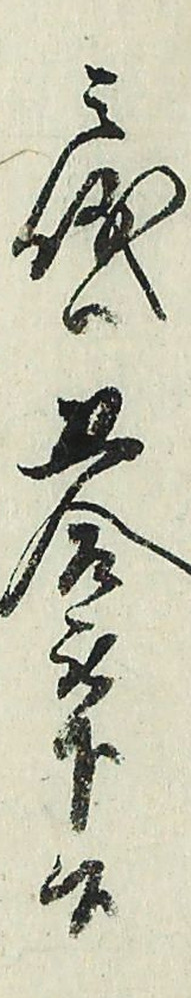之儀は五合被下候
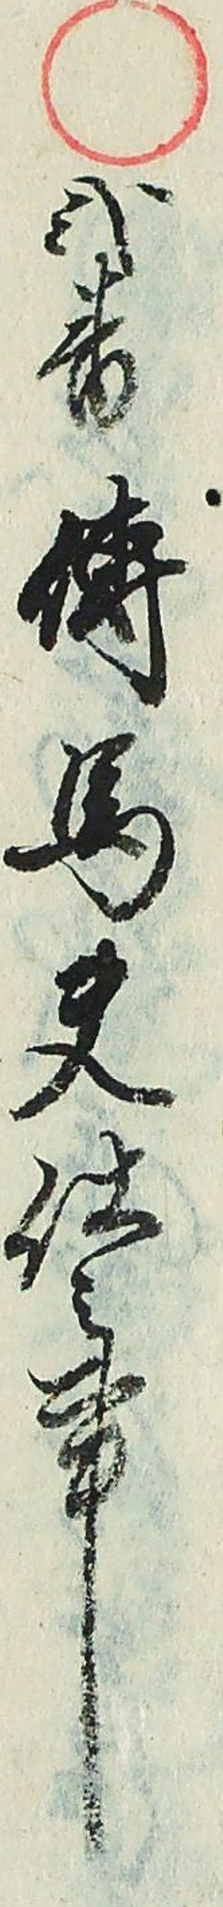二番伝馬夫仕之事
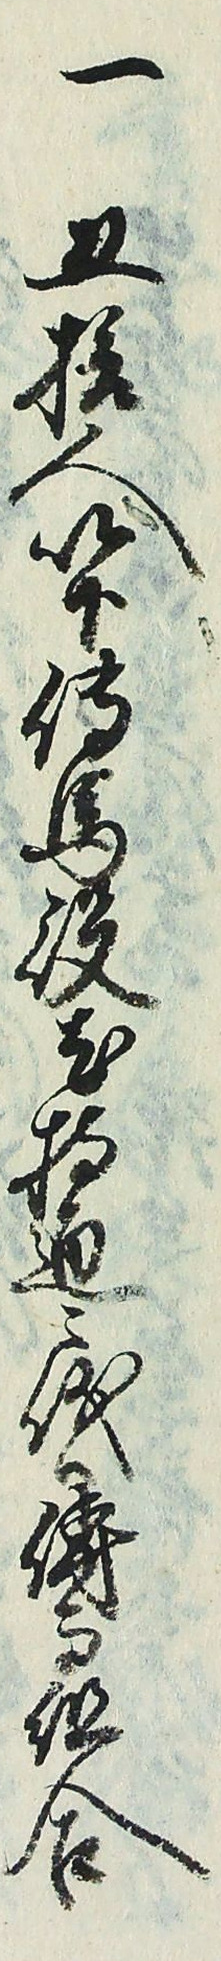一五十人以下伝馬役尤持通之儀は伝馬組合
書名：諸割賦物賃銀定記録帳
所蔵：鳴門教育大学 Naruto University of Education
